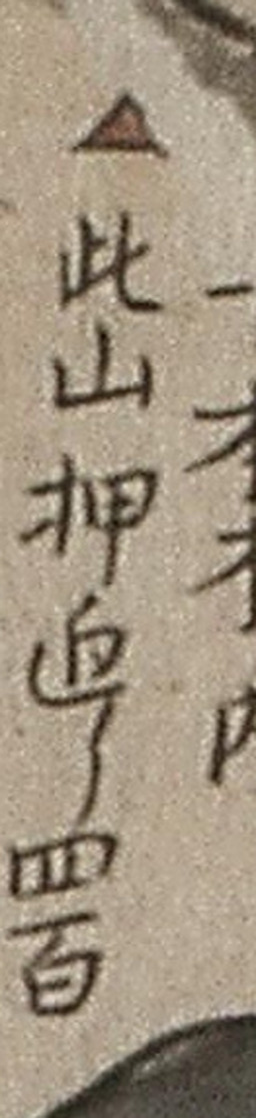▲此山押廻り四百
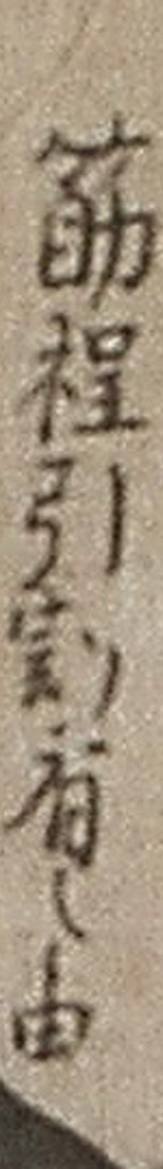筋程引割有之由
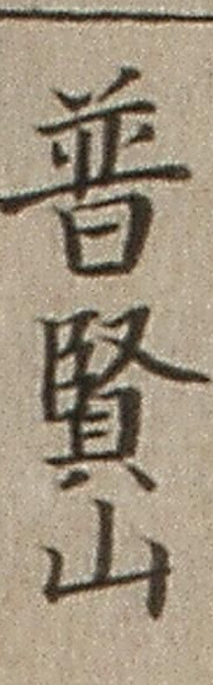普賢山
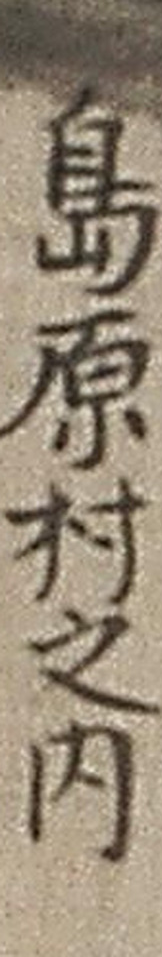島原村之内
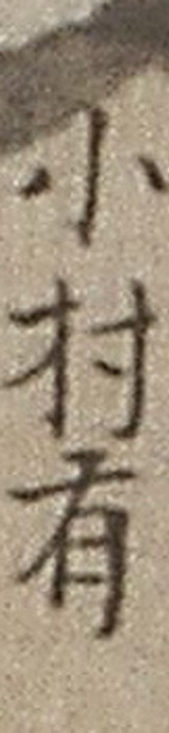小村有
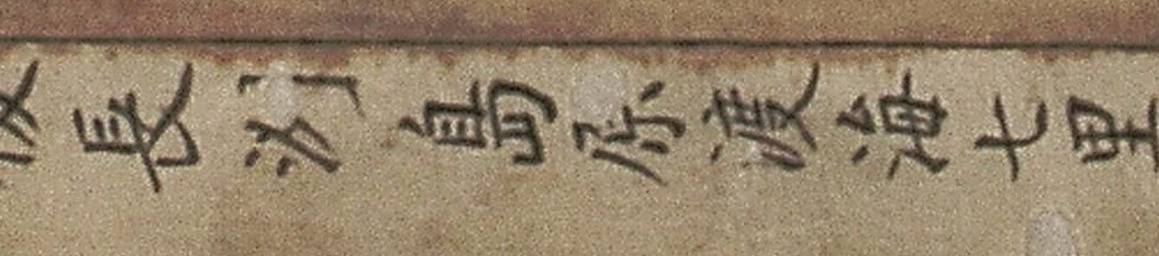肥後長洲島原渡海七里
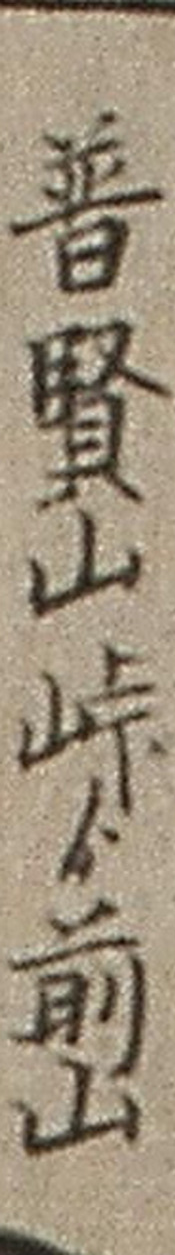普賢山峠ゟ前山
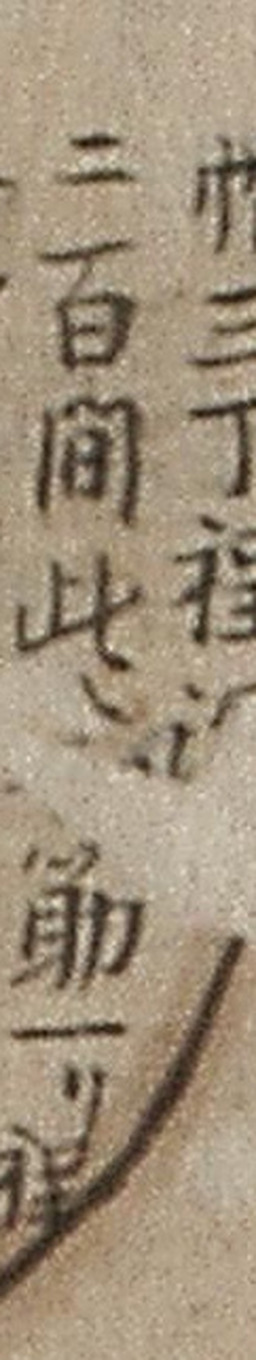二百間此筋一リ程
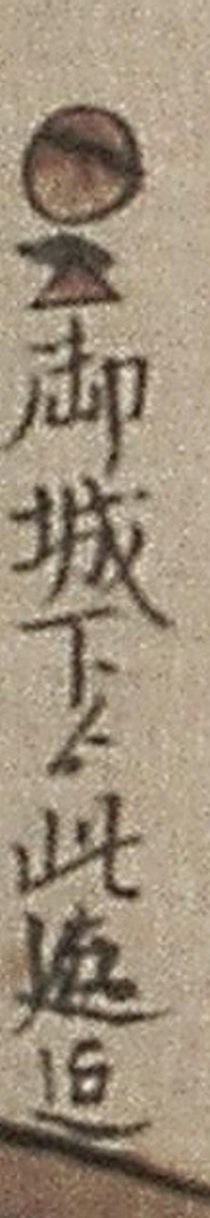●▲御城下ゟ此辺迄
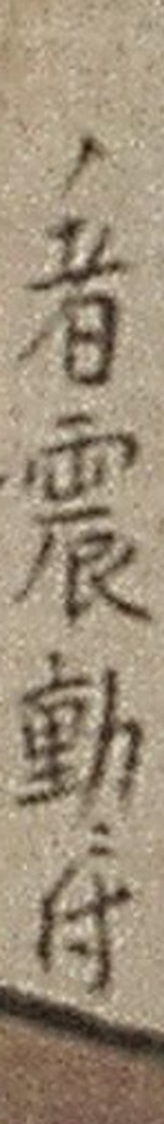ノ者震動二付
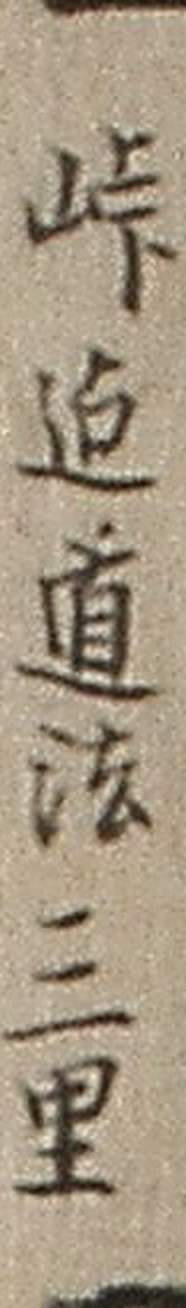峠迄道法三里
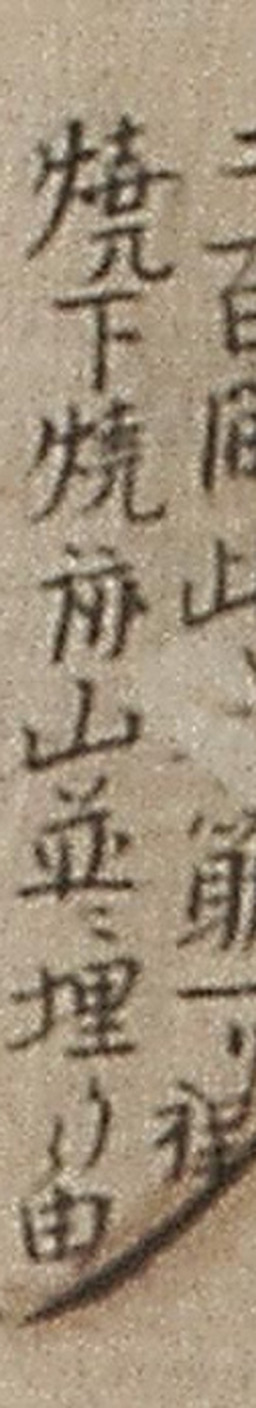焼下焼前山並二埋り候由
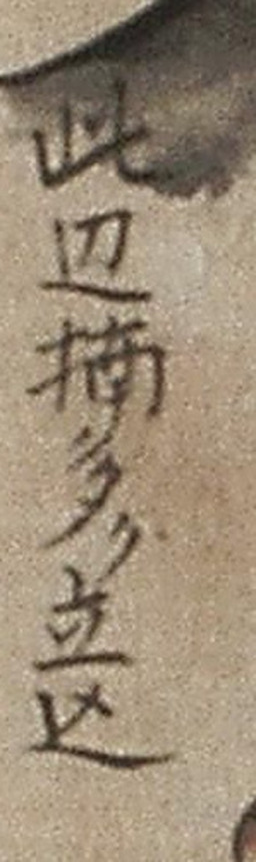此辺楠多立込
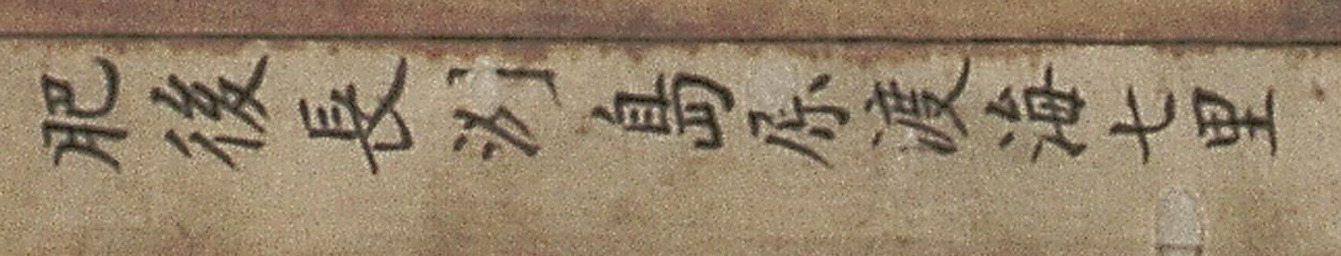肥後長洲島原渡海七里
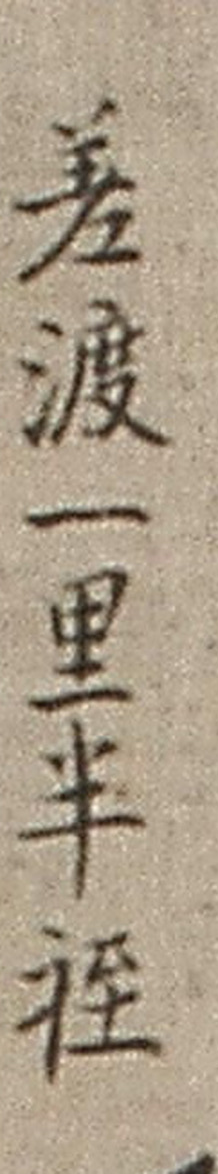差渡一里半程
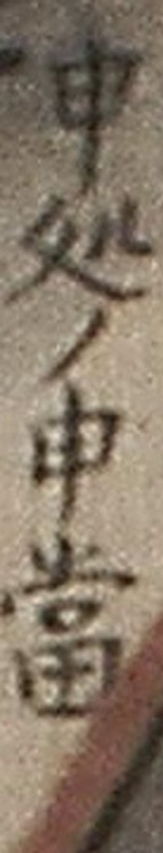申処ノ申当
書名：太平秘録抜書　浅間山燒及普賢山崩
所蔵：東京大学地震研究所図書室 Earthquake Research Institute Library, The University of Tokyo, JAPAN
